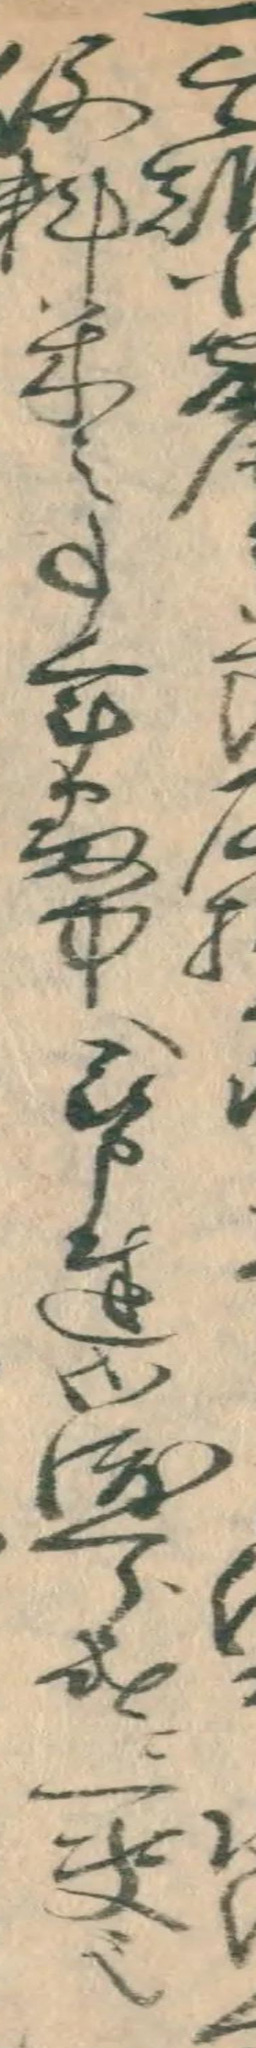役料米之事年番中へ被申達御渡可被遣ニ一決也
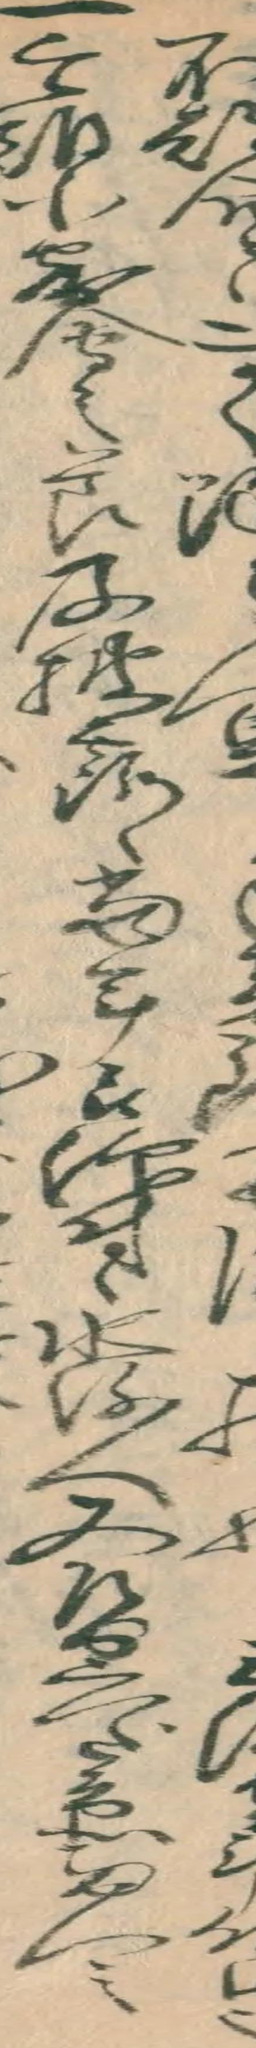一今朝小寄会之節及披露候当年被仰付候水役人又左衛門六郎兵衛両人之
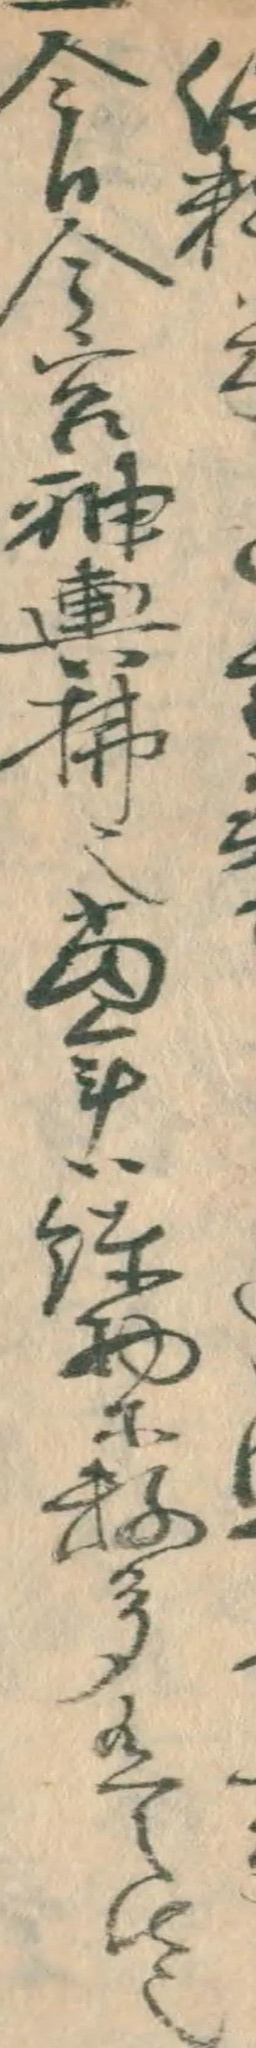一今日今宮神輿払也当年ハ練物等数多有之由也
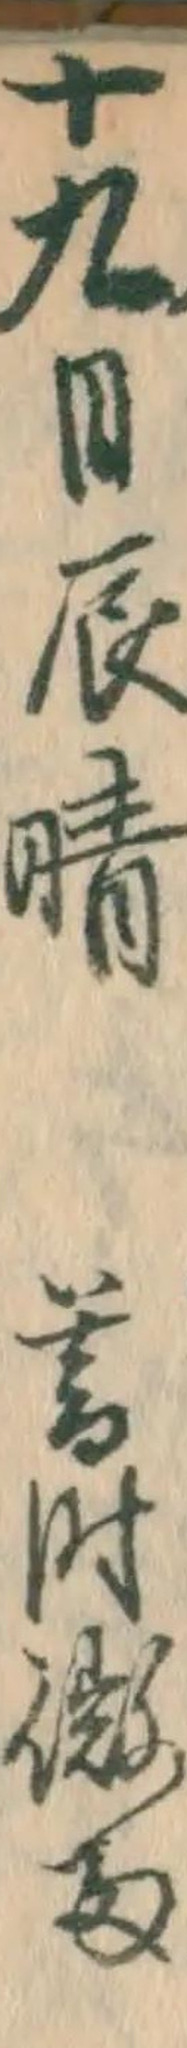十九日辰晴暮時微雨
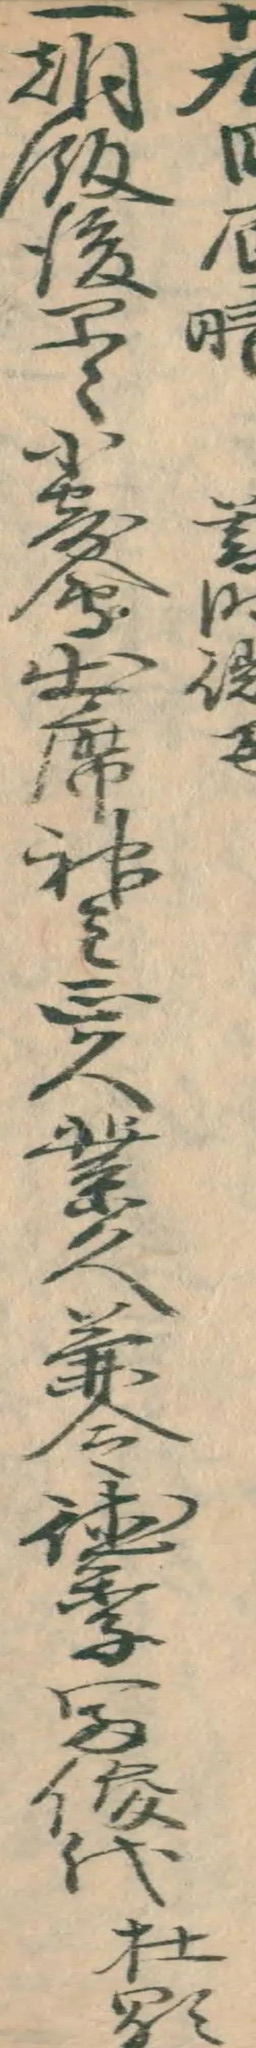一朝飯後早々小寄会出席神主正久業久兼令徳季冨俊代杜顕
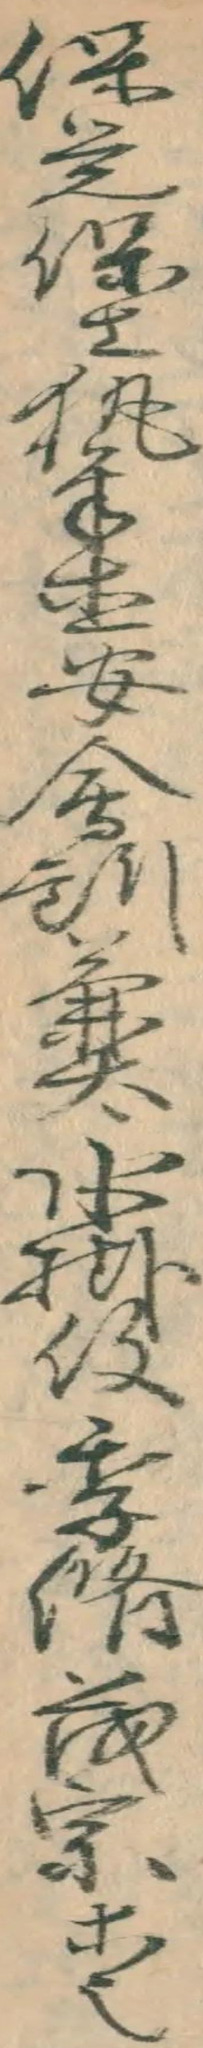保覚保士執筆直安会所兼太水掛役季脩茂宗等也

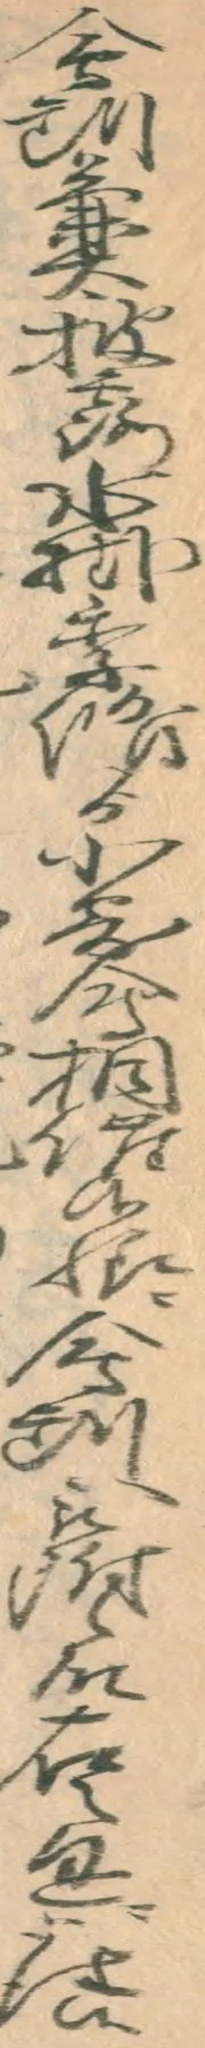会所兼太披露水掛季脩ゟ小寄会相催候様ニ会所へ被付候故右之通ニ御座候
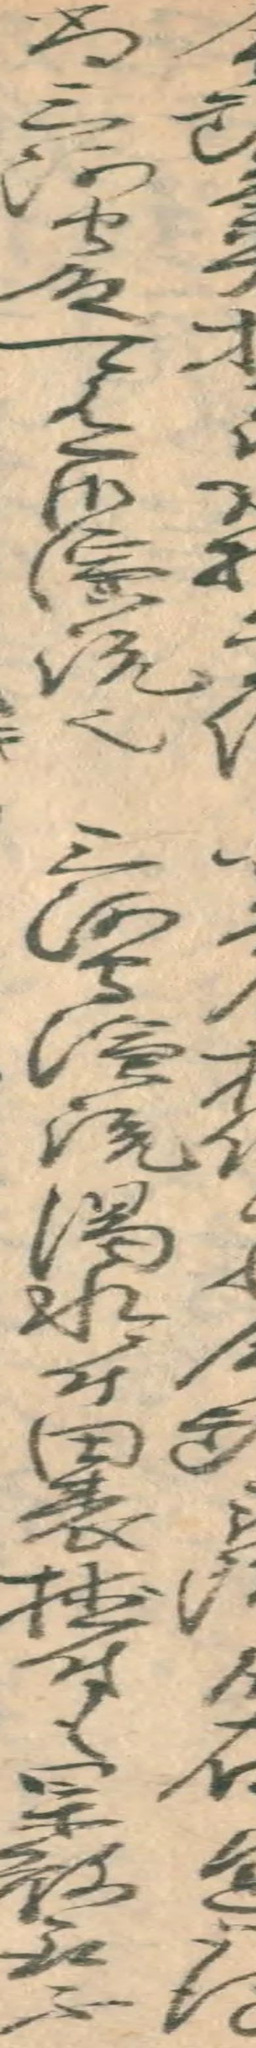尚三河守殿可有御演説也三河守演説渇水ニ付田表植付も果敢取不
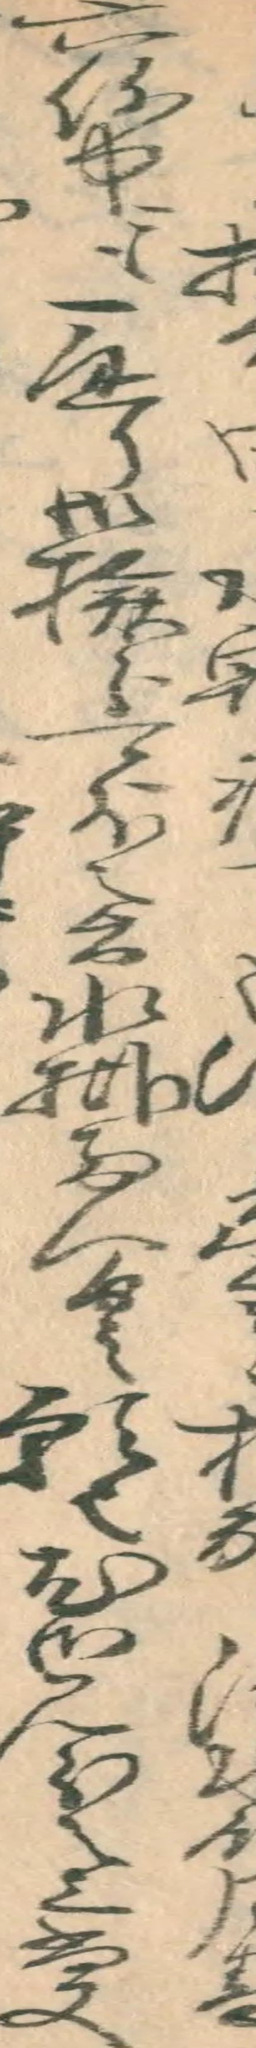六役中ニも一通り御検分可被下之旨水掛両人ゟ之願也尤御見分之上尚又
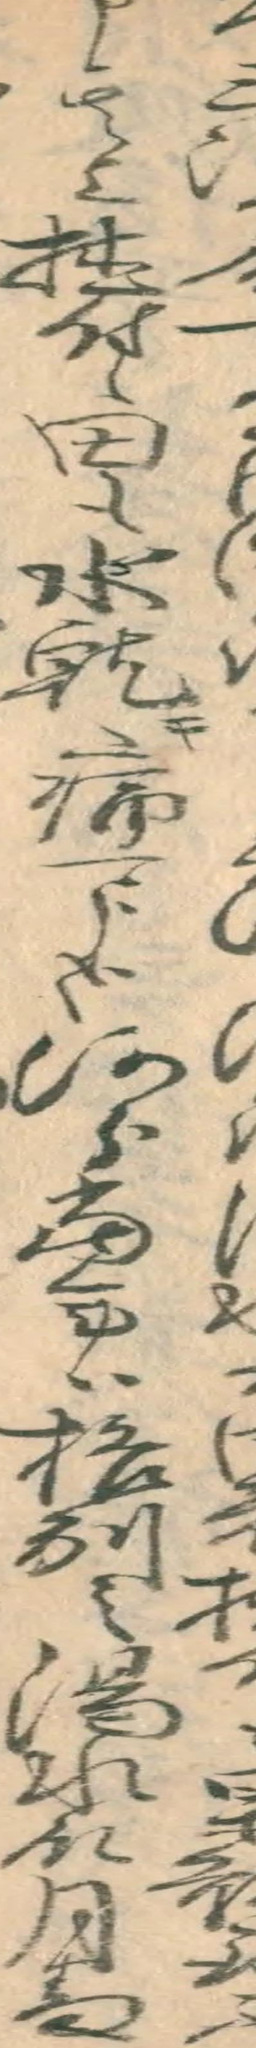申其上植付候田も水乾キ痛可申哉何分当年ハ格別之渇水故月番
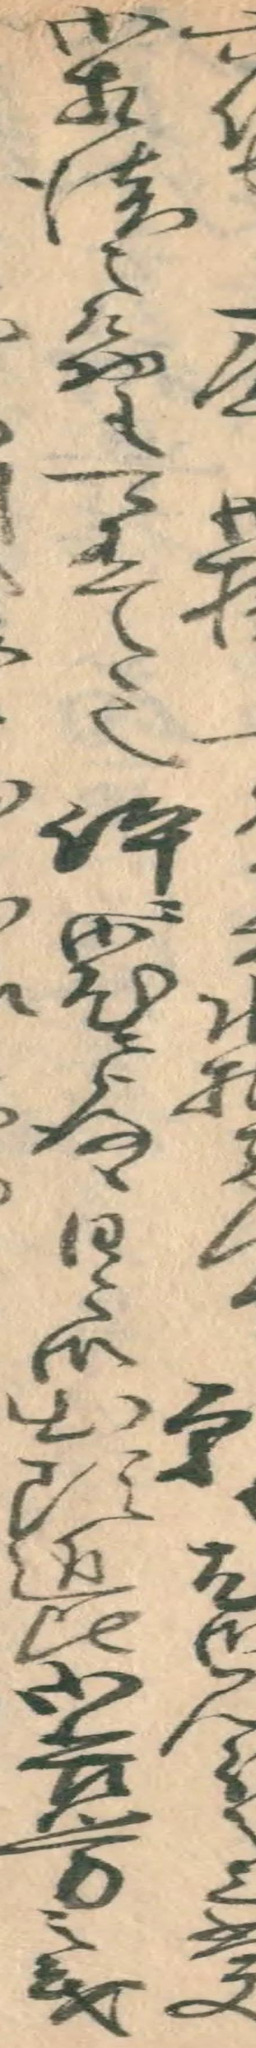御相談之筋も可有之候也評ニ御尤ニ被存候日々御出頭近比御苦労之義
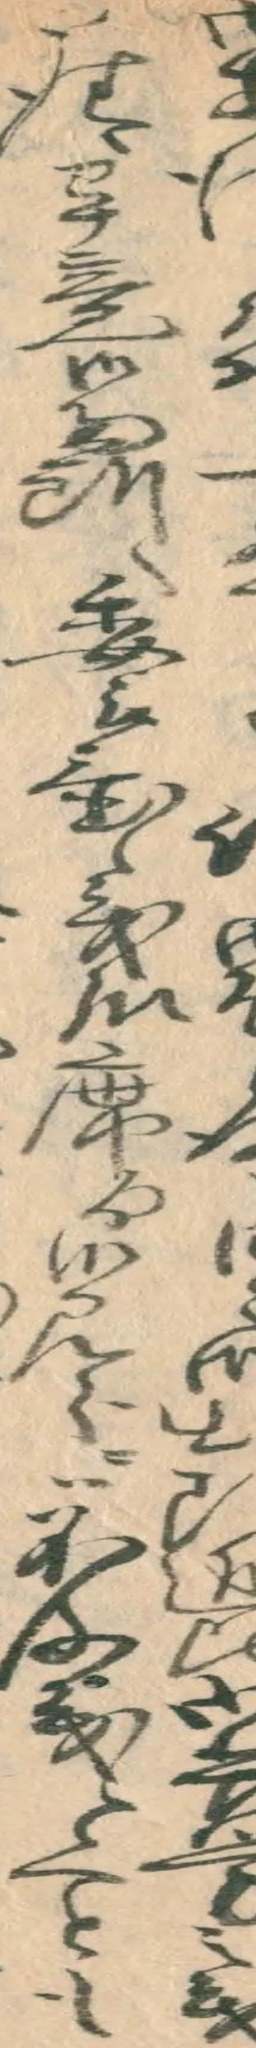御座候畢竟御両所へ委被置候義故席ゟ御見分ニハ不及義ニ候へとも
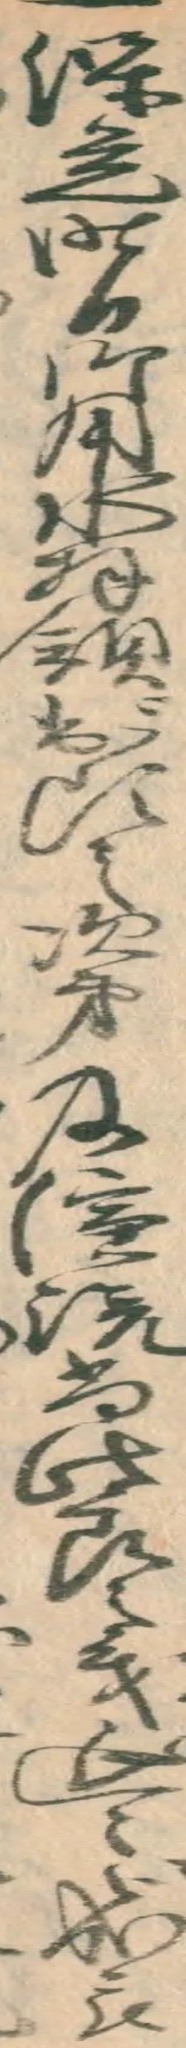一保覚昨日御用水拝領ニ出頭之次第及演説尚此節之義延々ニ被成被
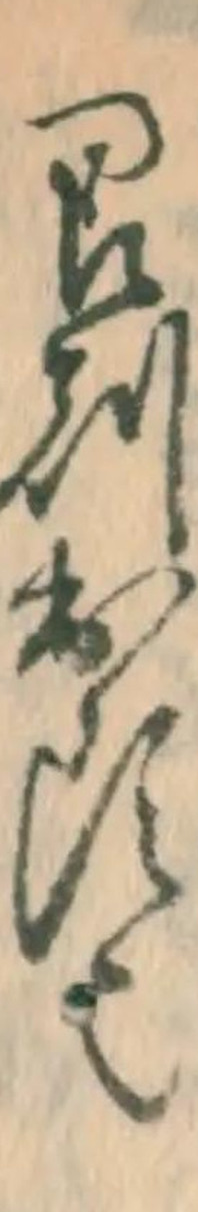即刻出頭也
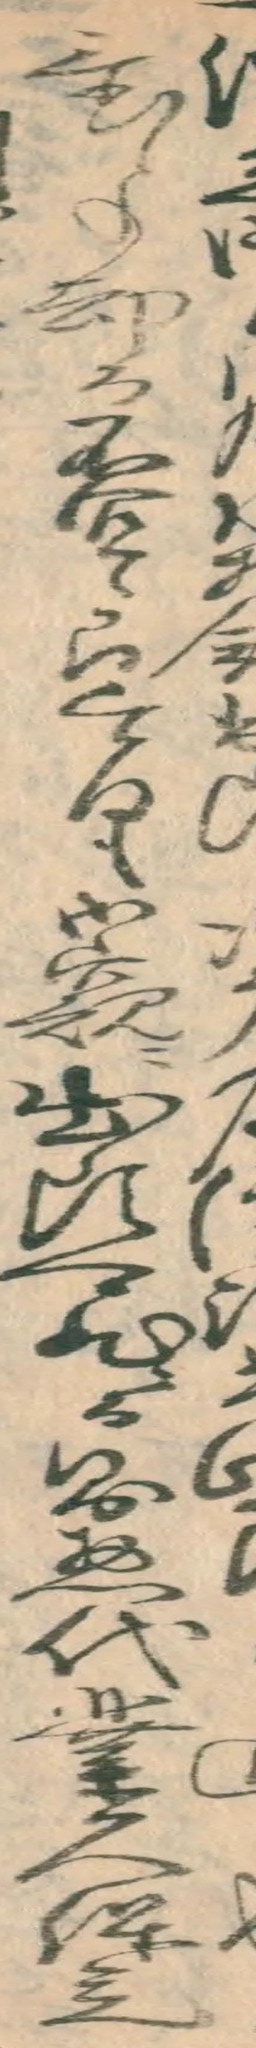置候事却而不宜候間今日も御窺ニ出頭可然ニ而則惣代業久保覚
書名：賀茂社記録. 第58冊
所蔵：国立国会図書館 National Diet Library, JAPAN
